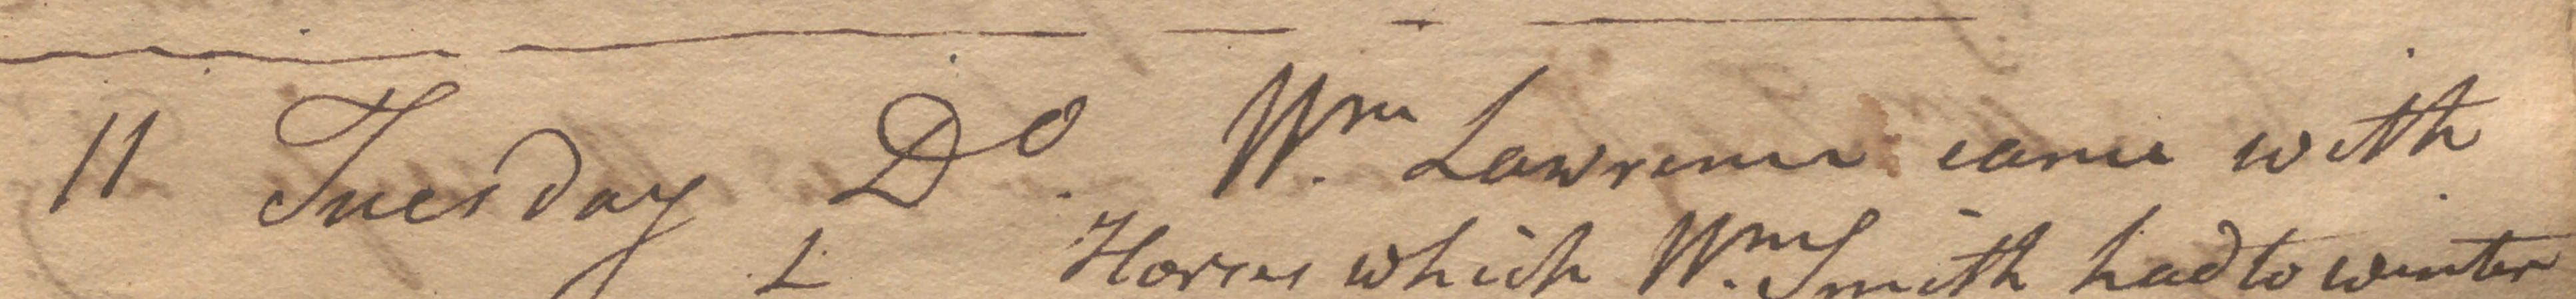1t Tuesday D^o.- M^r. Lawrence came with
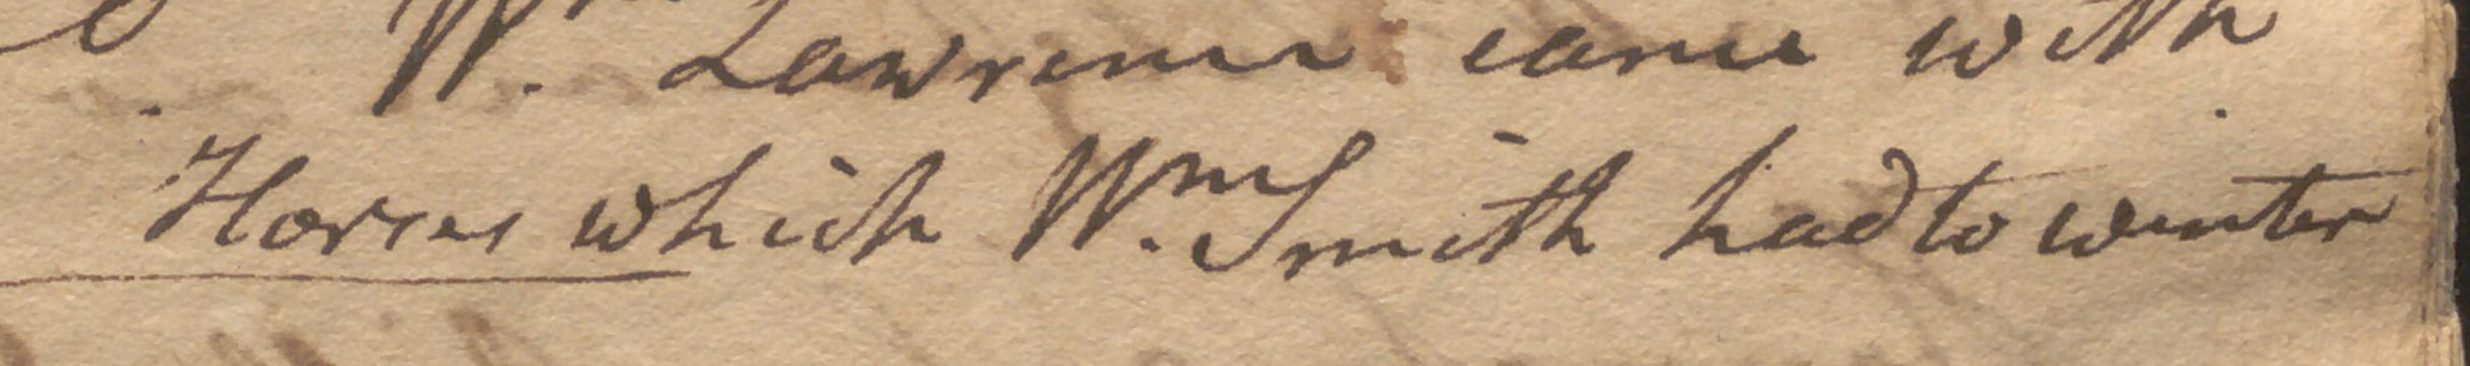Horses which W^m. Smith had to winter
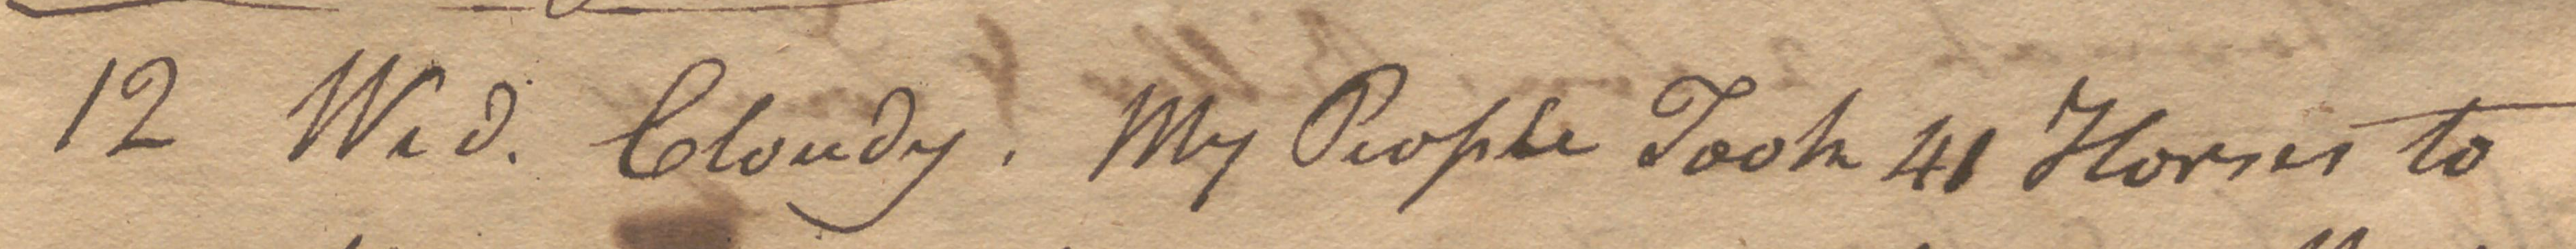12 Wed. Cloudy. My People Took 41 Horses to
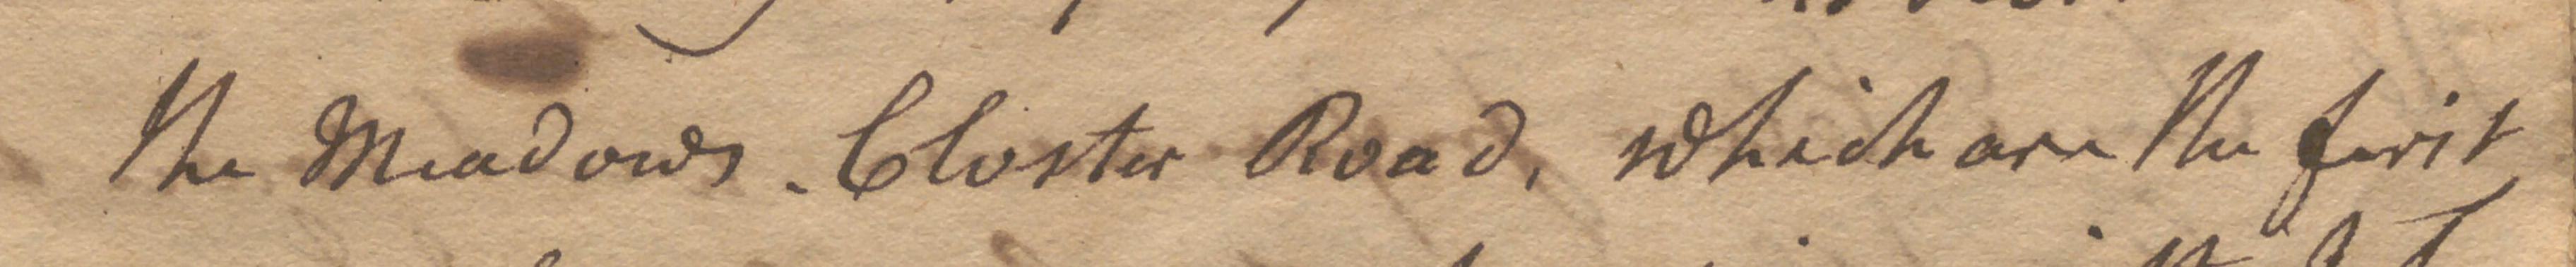The Meadows. Closter Read, which are the first
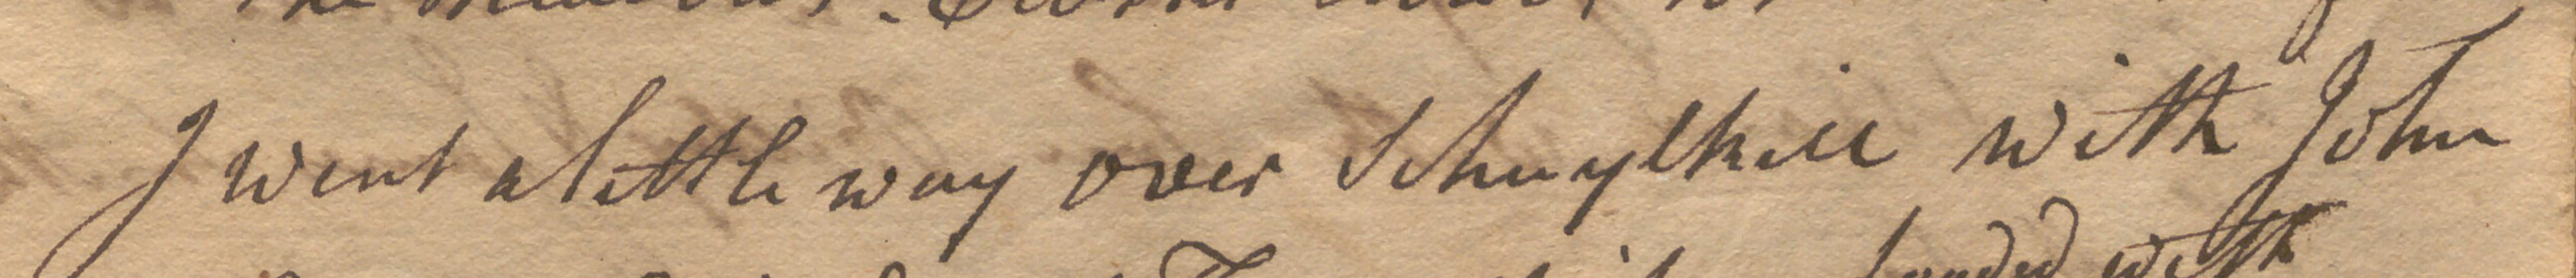I went a little way over Schuylkill with John
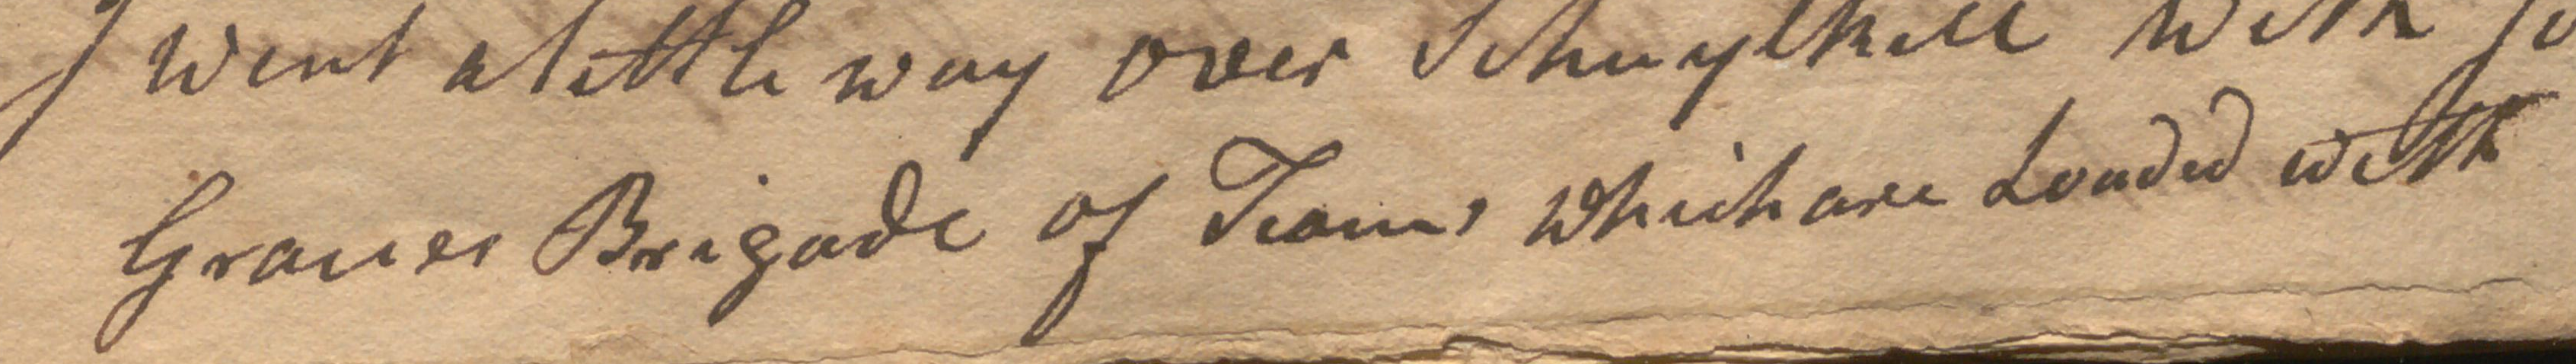Graves Brigade of Teams which are Loaded with
